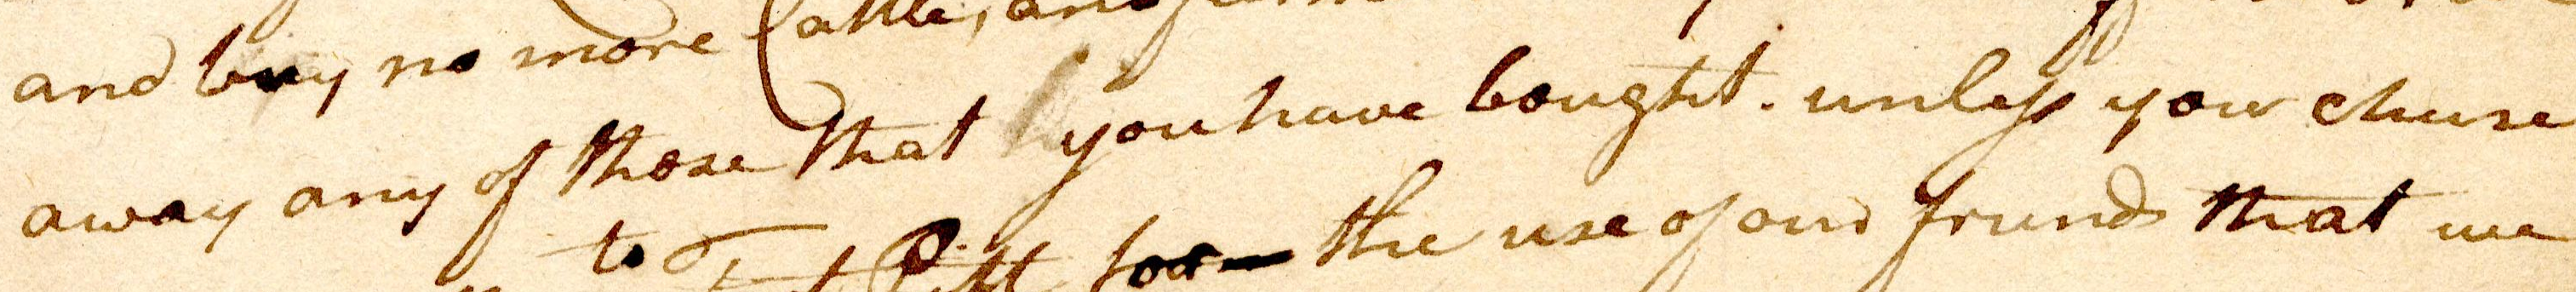away any of those that you have bought unless you chuse
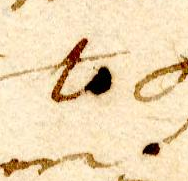to
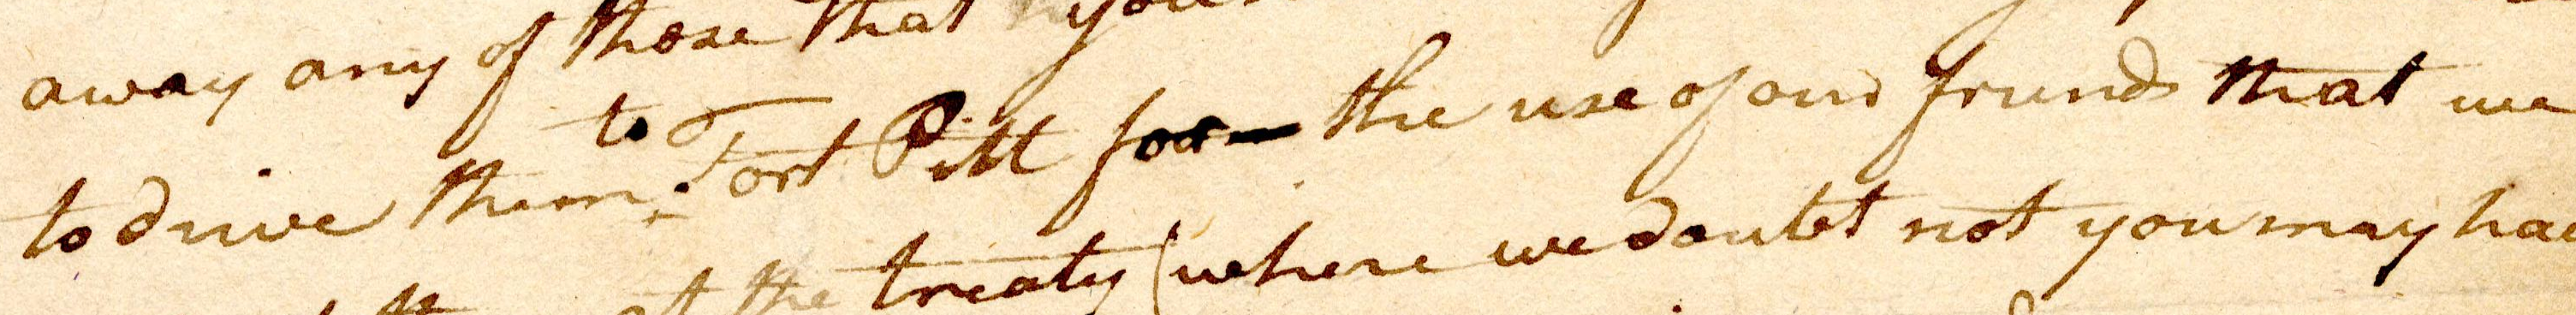to drive them ^ Fort Pitt for the use of our friends that we
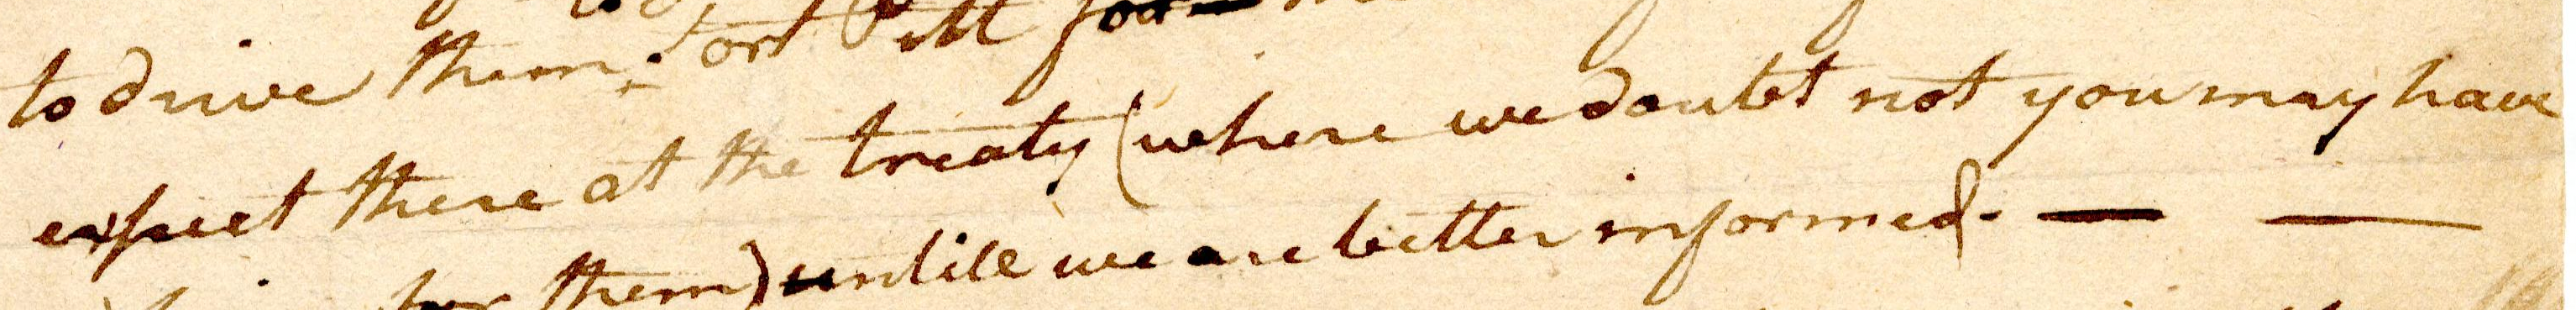expect there at the treaty (where we doubt not you may have
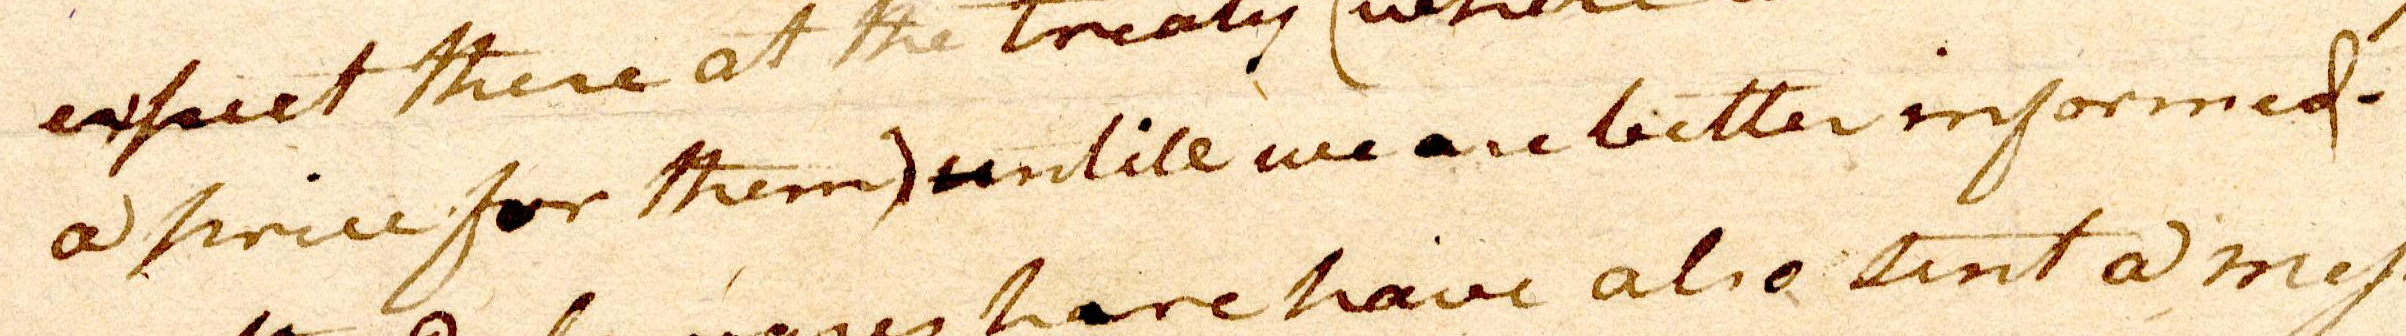a price for them) untill we are better informed-
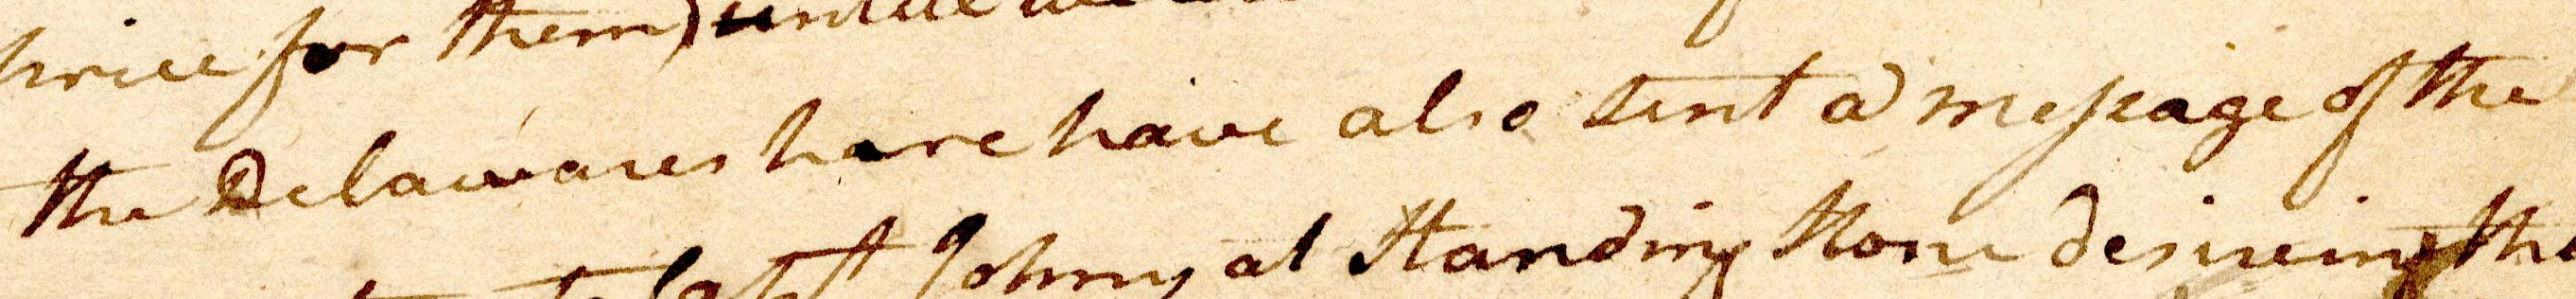The Delawares here have also sent a message of the
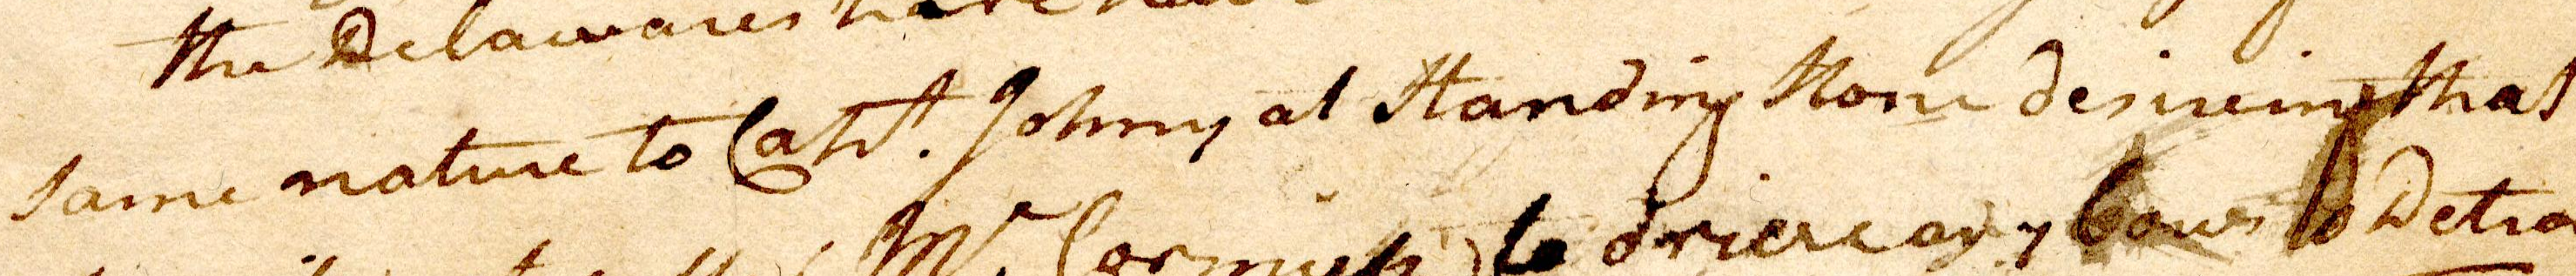same nature to Cap^t. Johny at Standing Rone desireing that
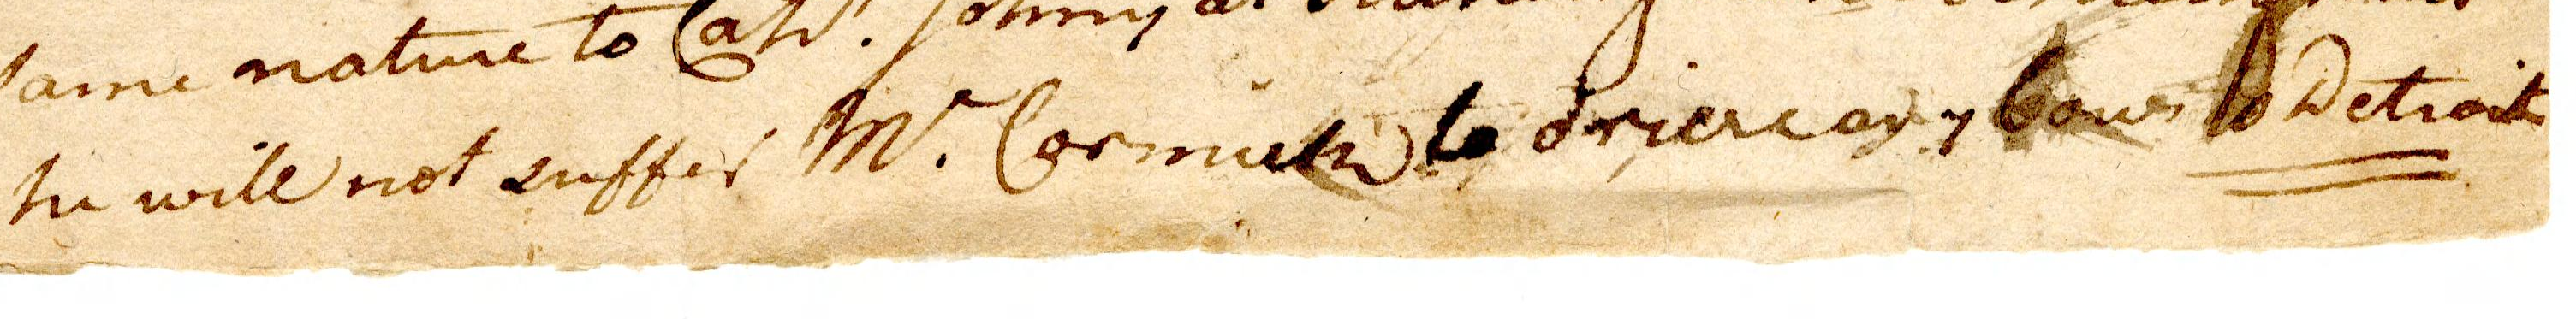he will not suffer M^cCormick to drive any Cows to Detroit
